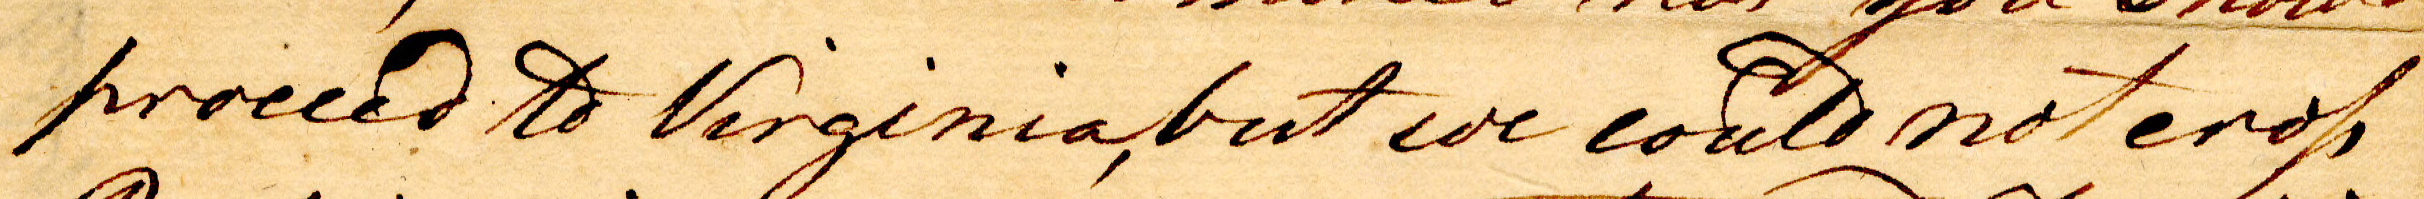proceed to Virginia, but we could not cross
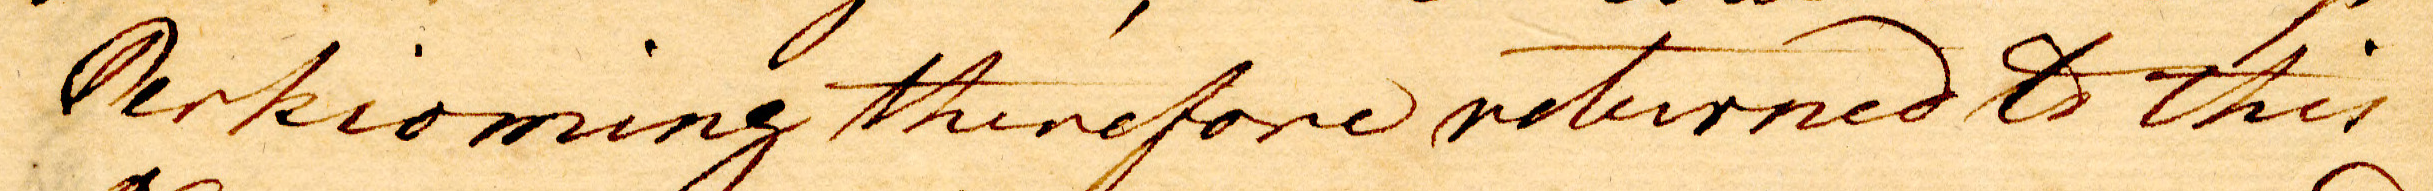Perkioming therefore returned to this
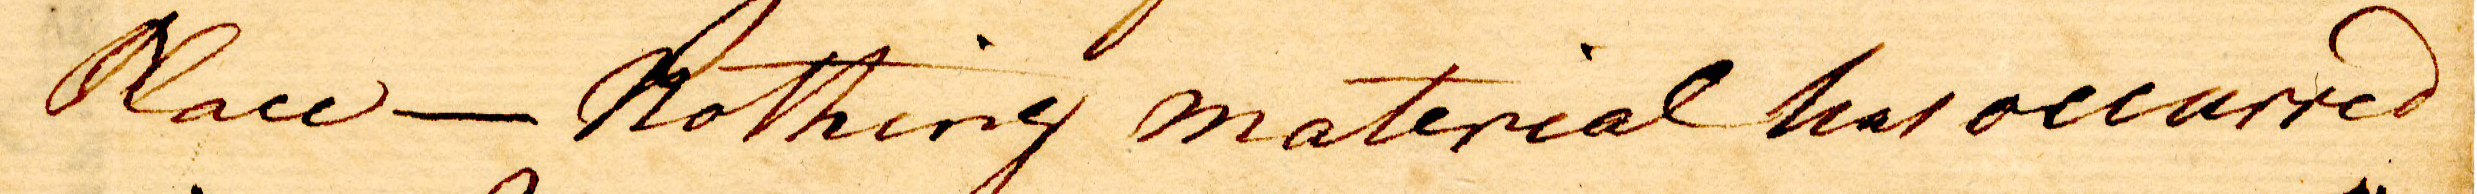Place- Nothing material has occurred
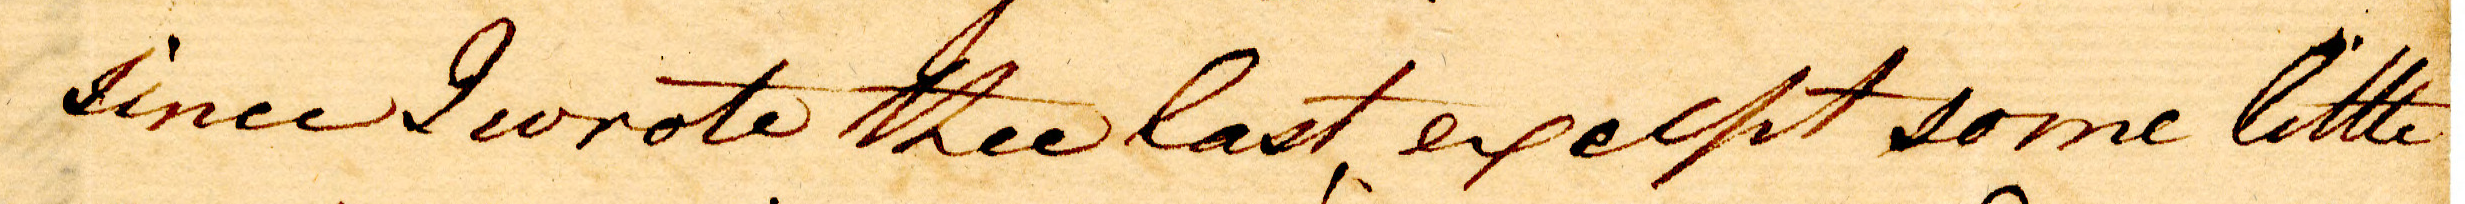since I wrote thee last, except some little
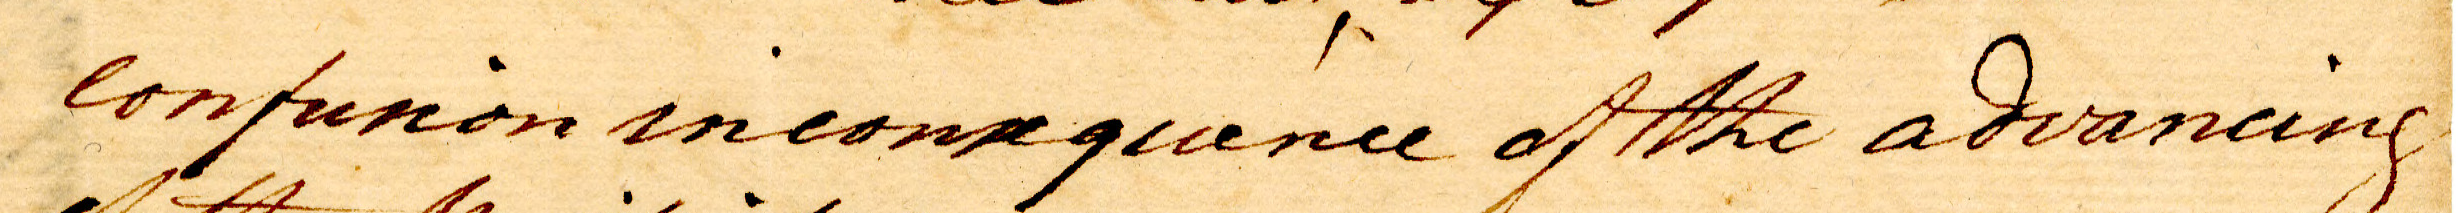confusion in consequence of the advancing
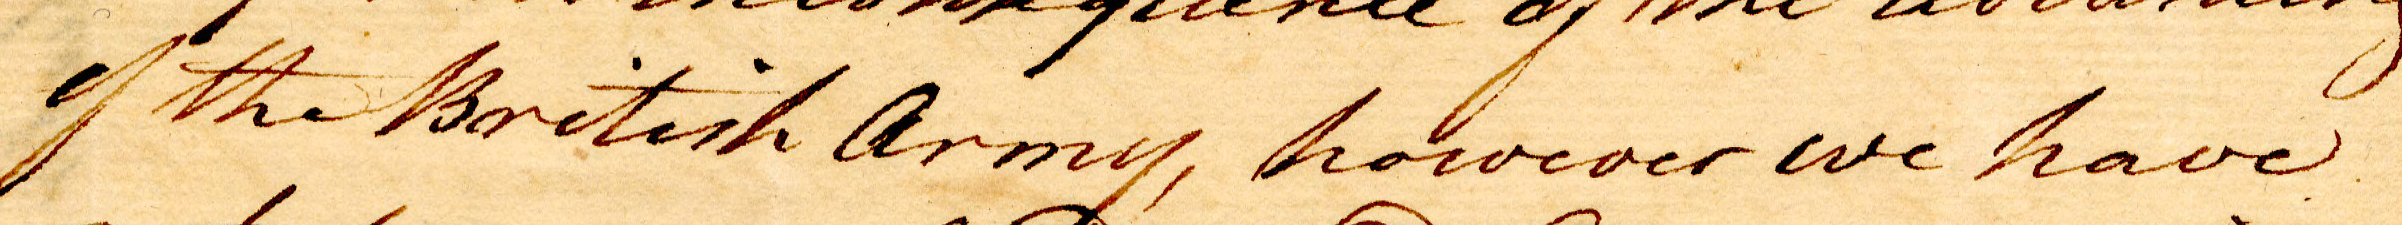of the British Army, however, we have
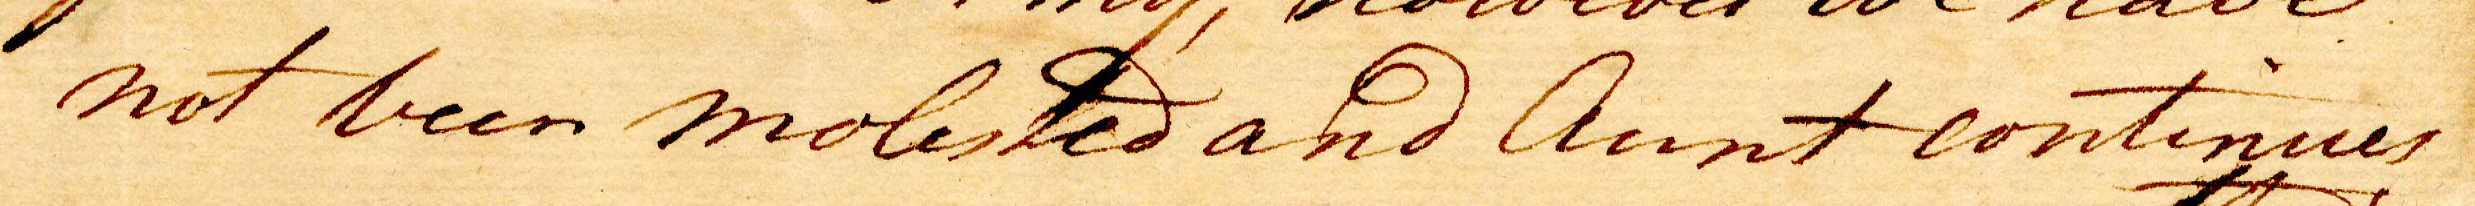not been molested and Aunt continues
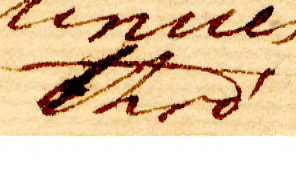thro'
